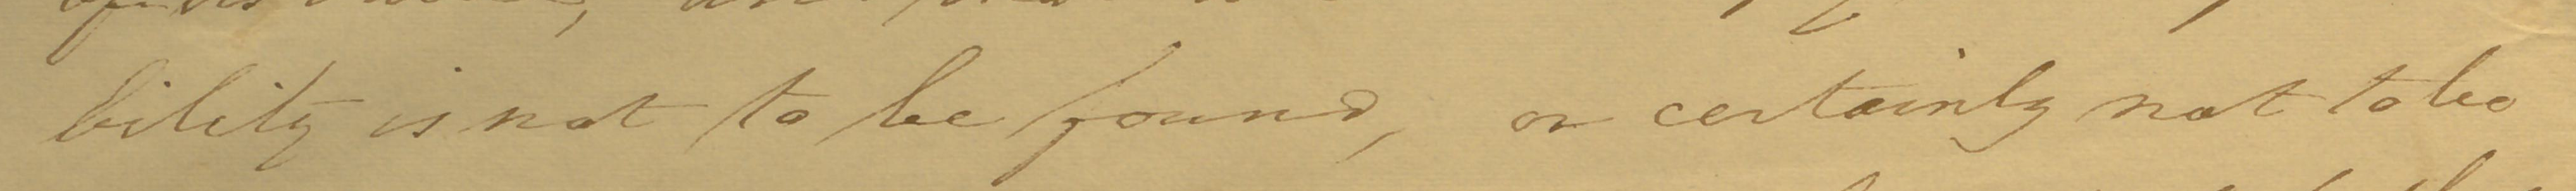bility is not to be found, or certainly not to be
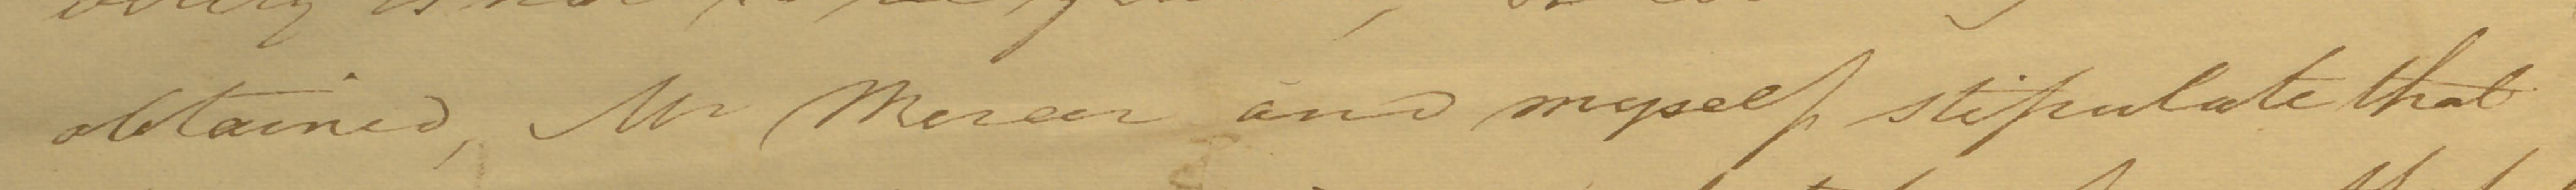obtained, M^r Mercer and myself stipulate that
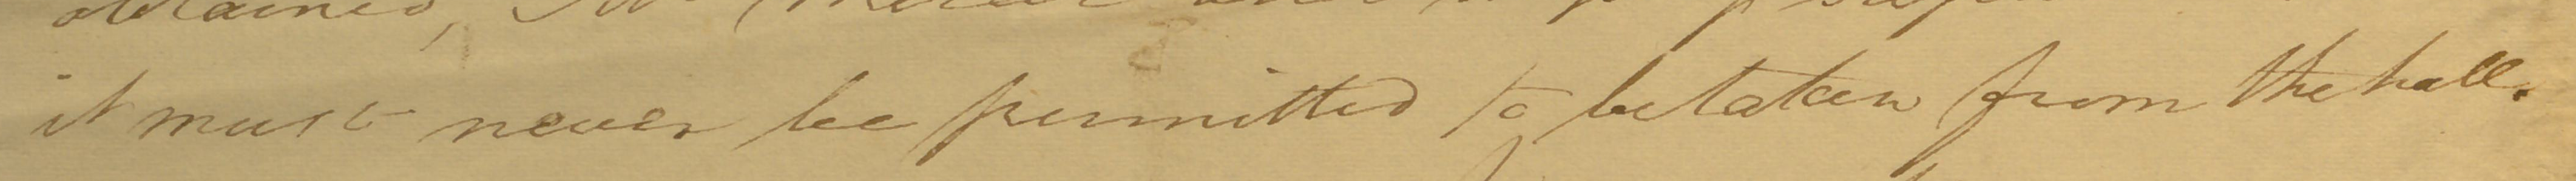it must never be permitted to be taken from the hall.
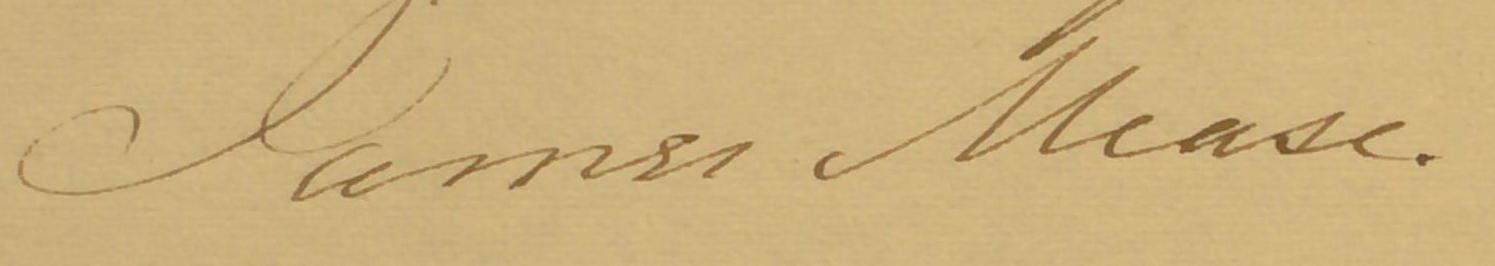James Mease.
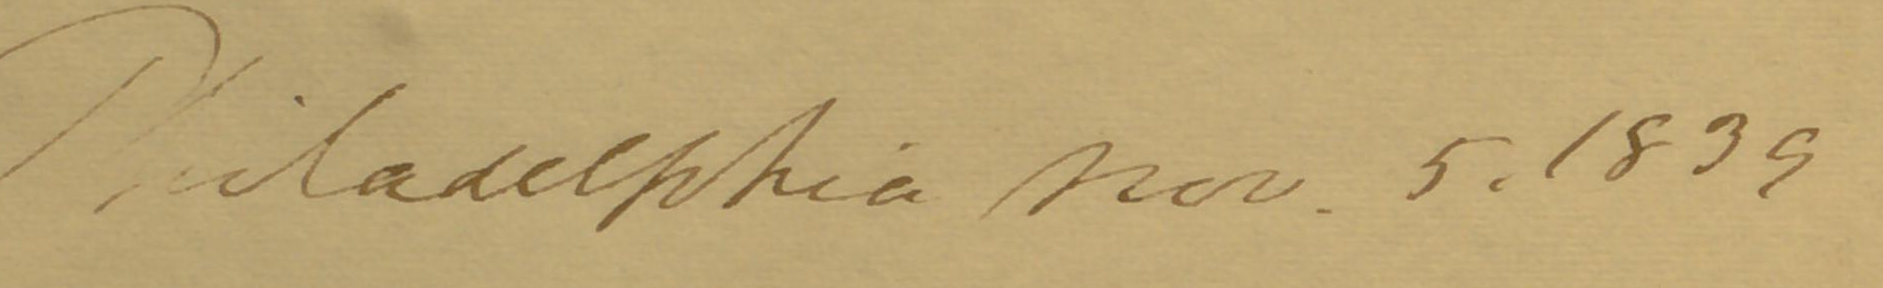Philadelphia Nov. 5. 1839
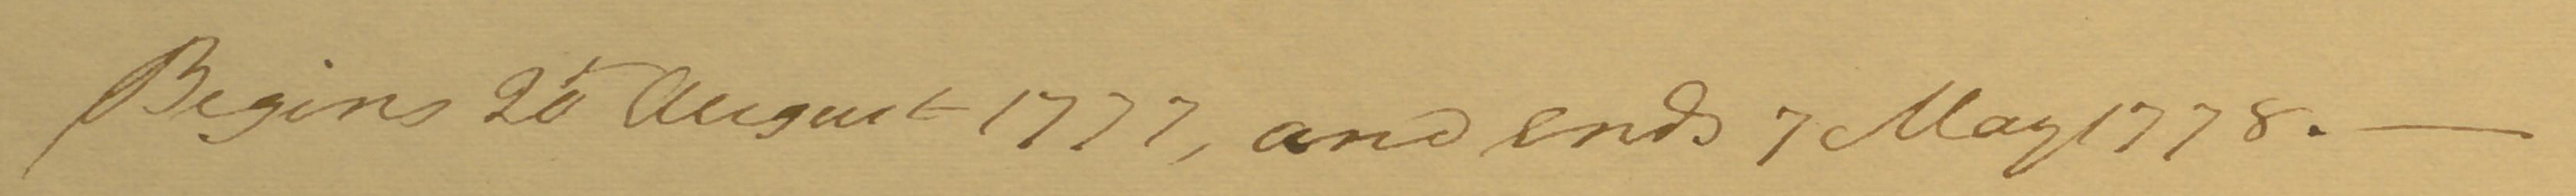Begins 25 August 1777, and ends 7 May 1778.-
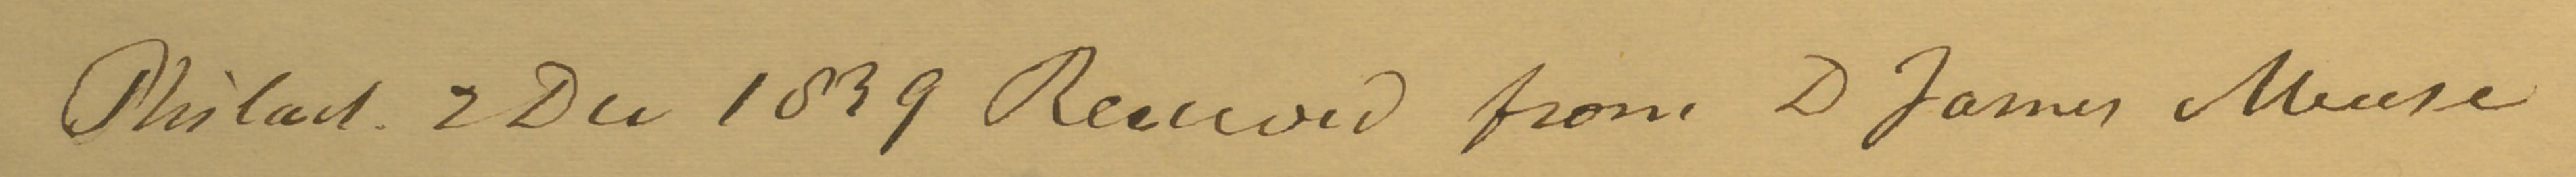Philad. 2 Dec 1839 Received from D James Mease
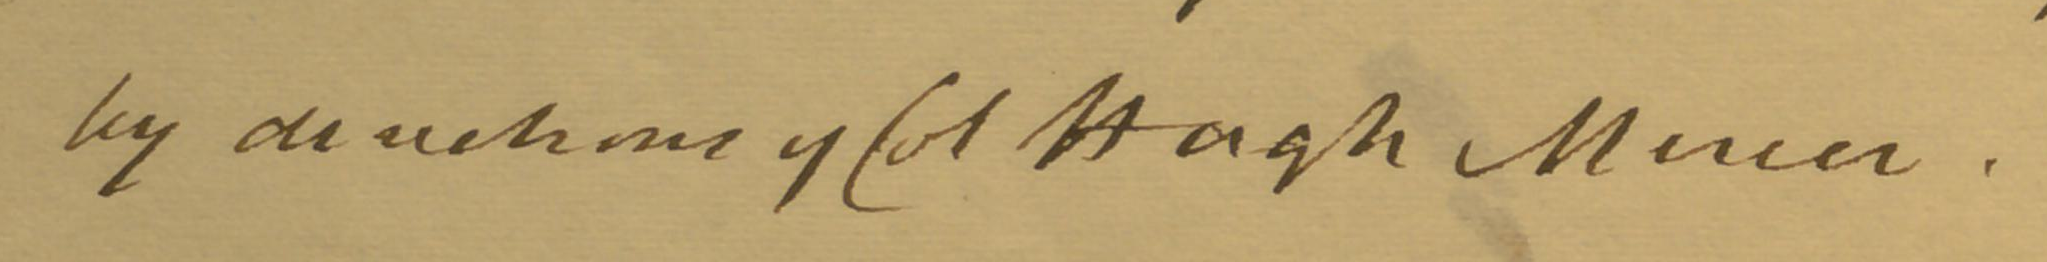by direction of Col Hugh Mercer
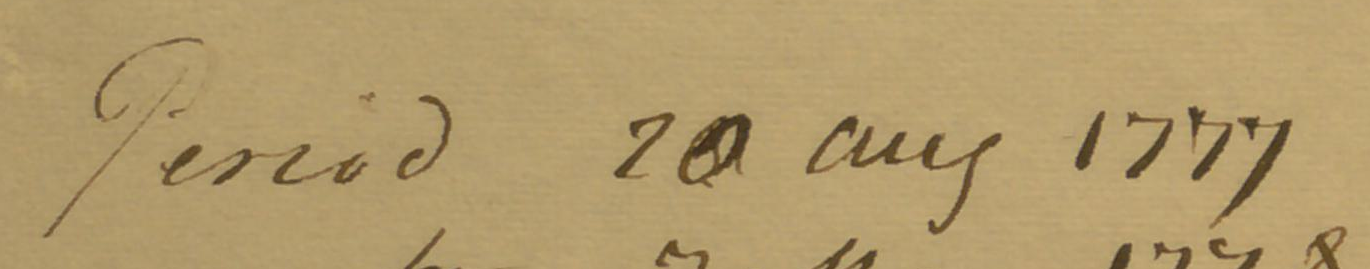Period 20 Aug 1777
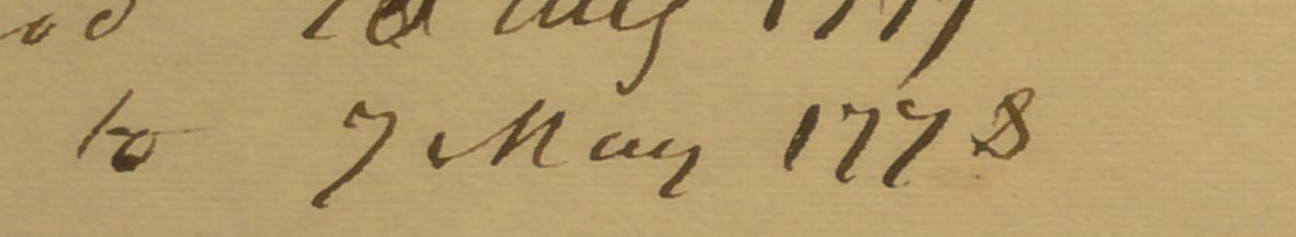to 7 May 1778
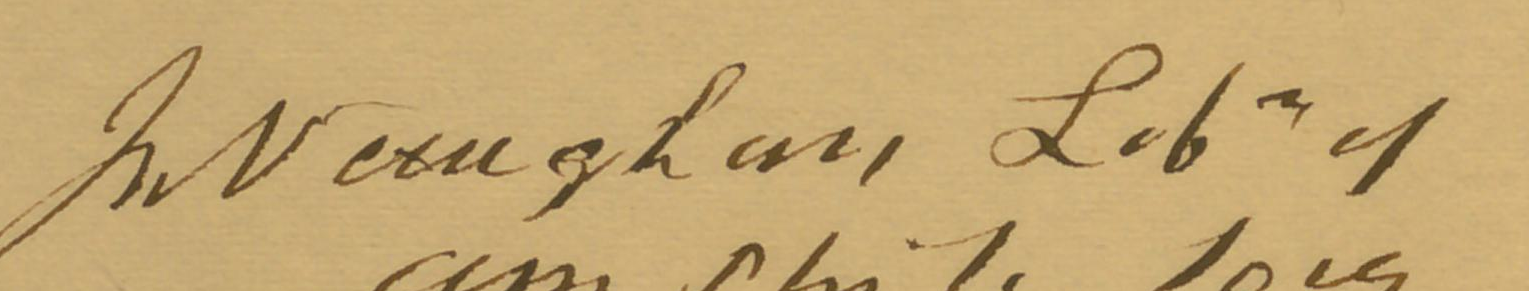Jn Vaughan Lib^r of
